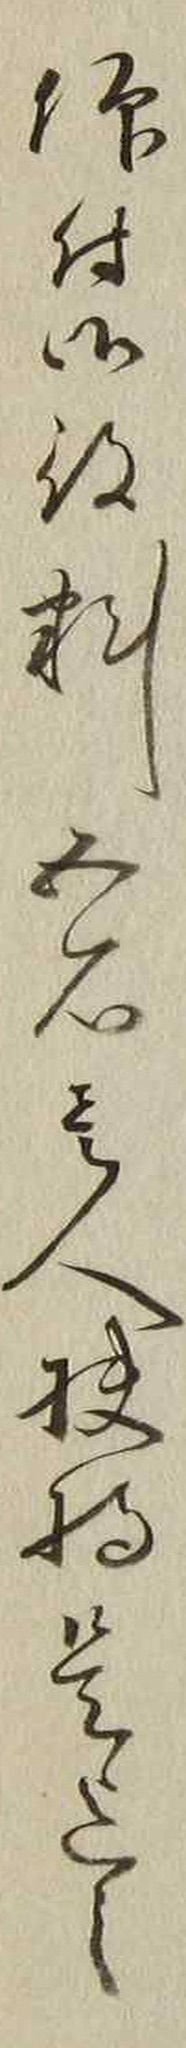仰付御役料五石壱人扶持是迄之
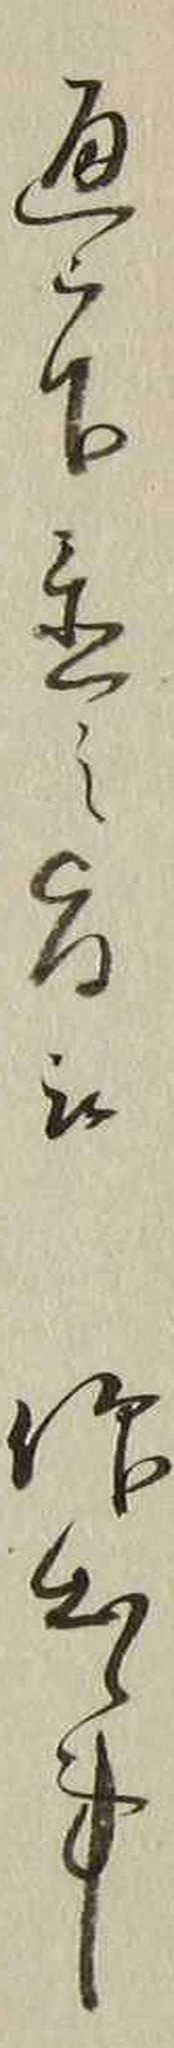通被下置之旨被仰出候事
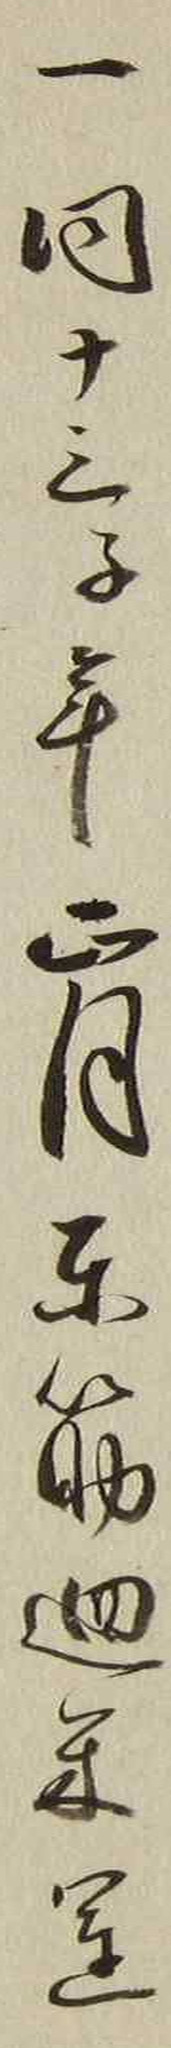一同十三子年正月東筋廻米運
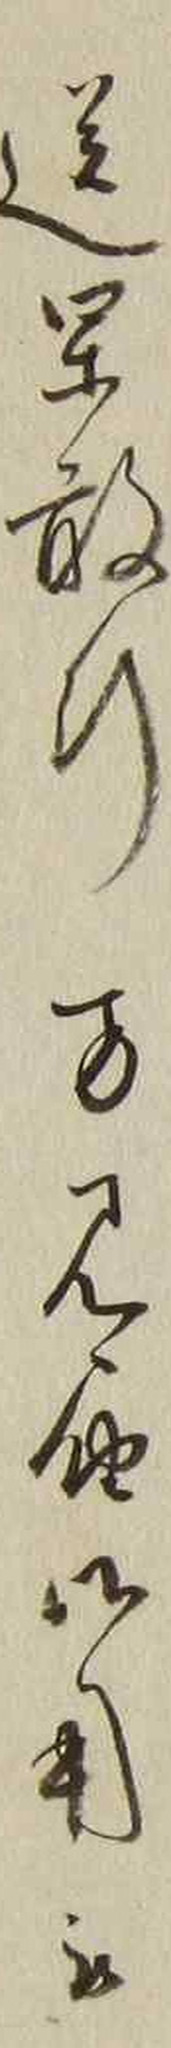送果敢行方見届御用被
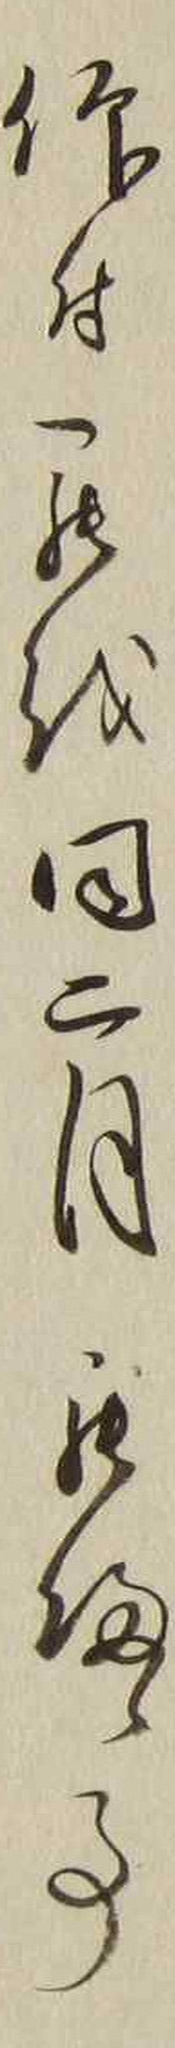仰付罷越同二月罷帰候事

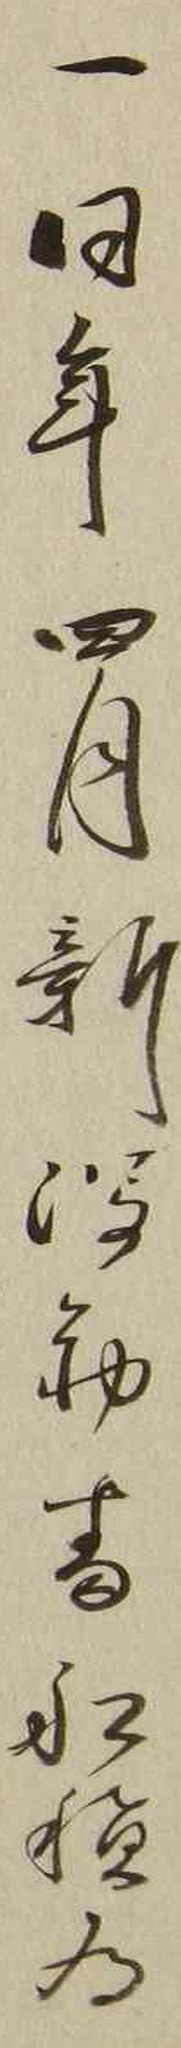一同年四月新潟勤番船積為
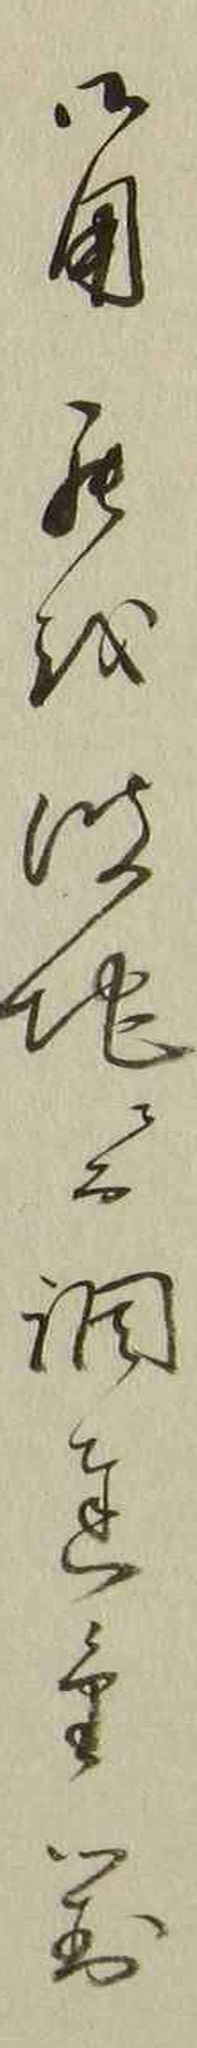御用罷越彼地ニ而調達金対
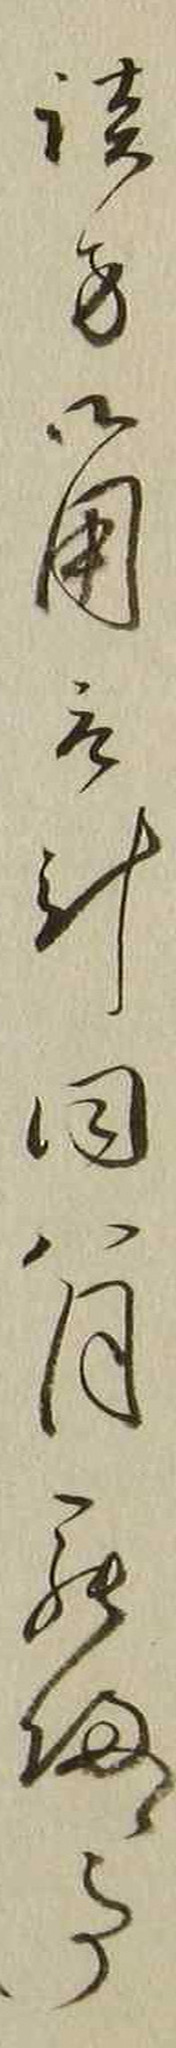談方御用取計同八月罷帰候事
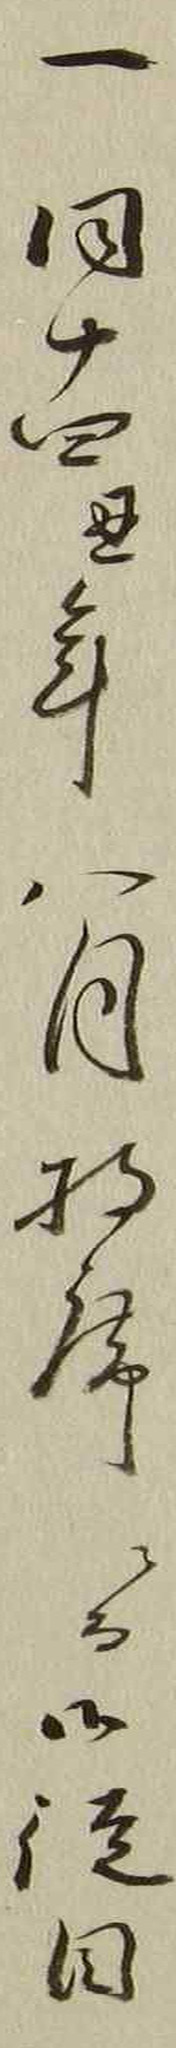一同十四丑年八月持席ニ而御徒目
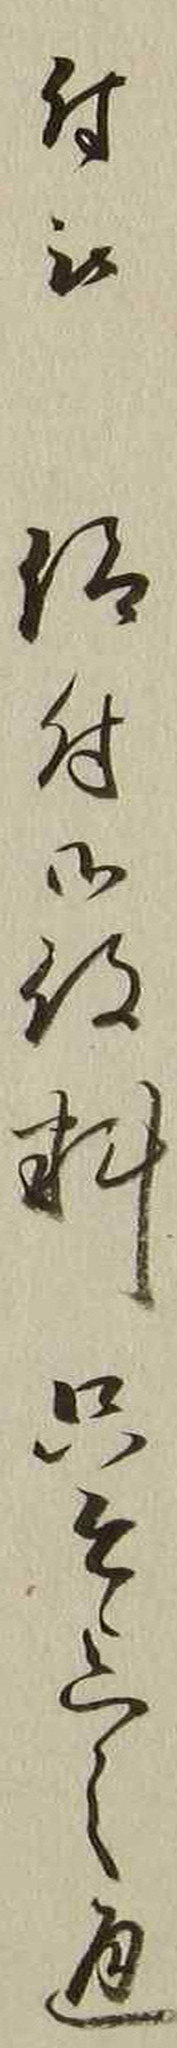付被仰付御役料只今迄之通
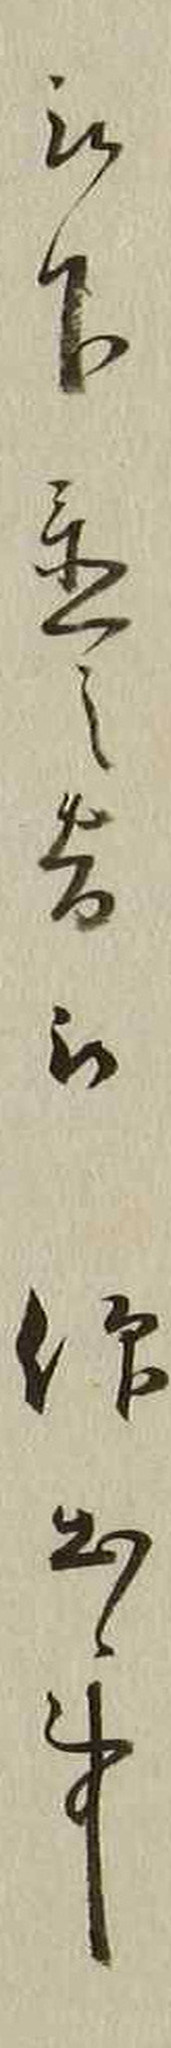被下置之旨被仰出候事
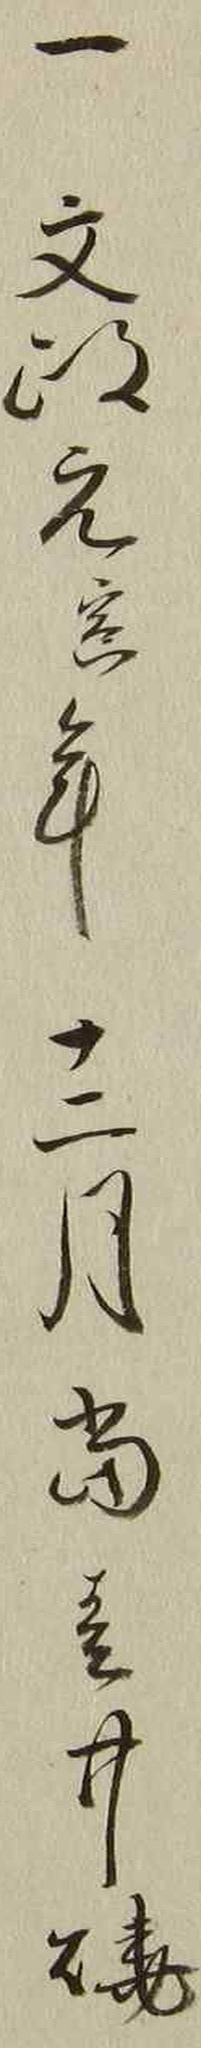一文政元寅年十二月当春中焼
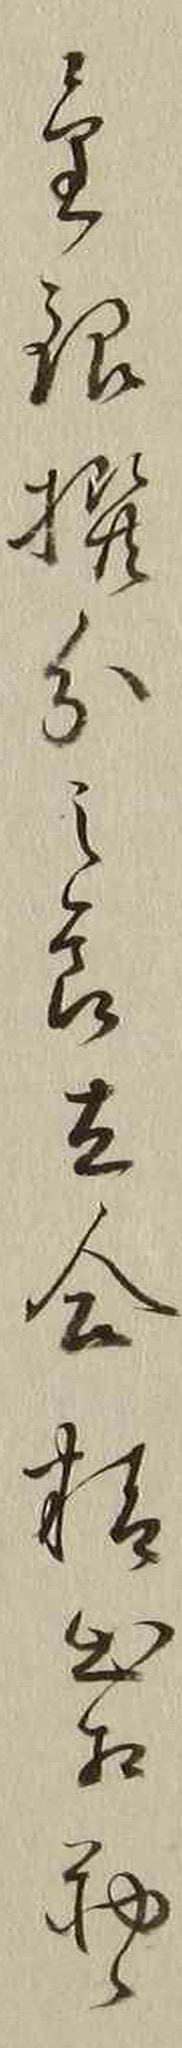金銀撰分之節立合精出相勤候
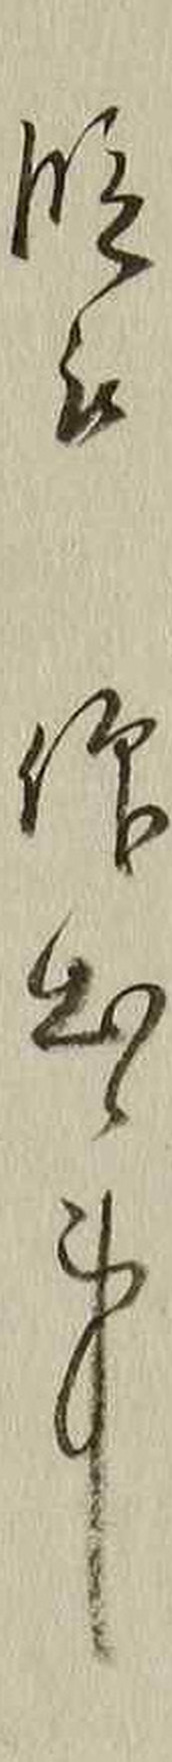段被仰出候事
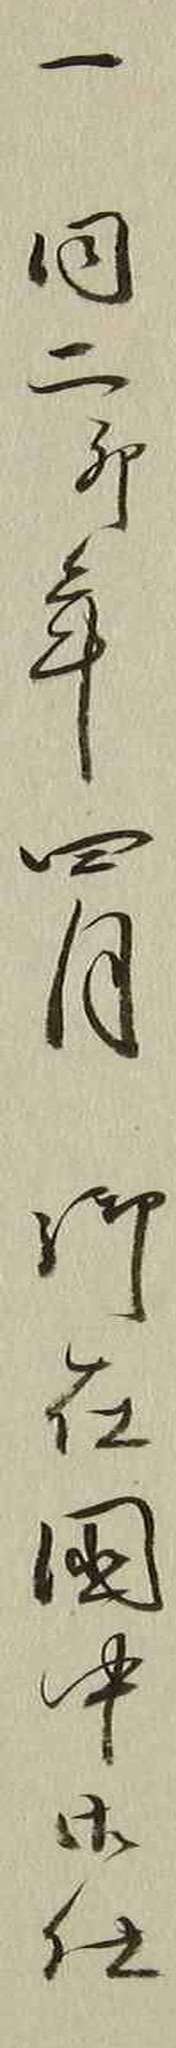一同二卯年四月御在国中御仕
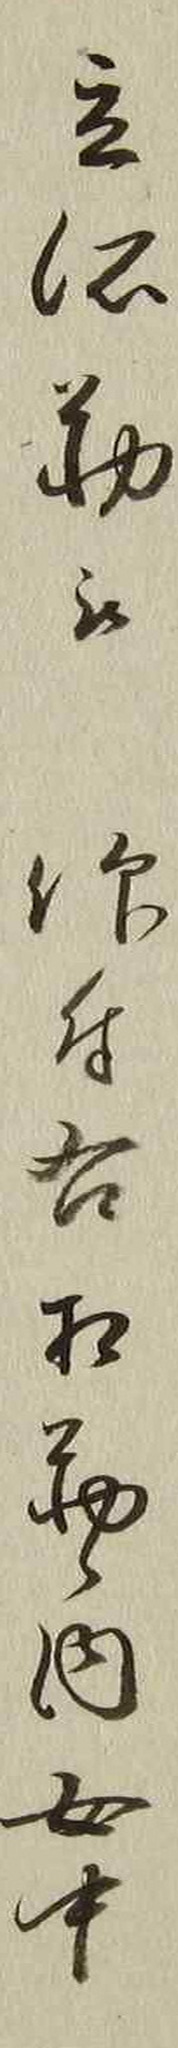立所勤被仰付右相勤候内女中
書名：諸士系譜　巻之52　に之部3
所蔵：会津若松市立会津図書館
